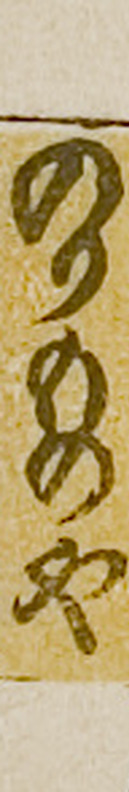のりものや
